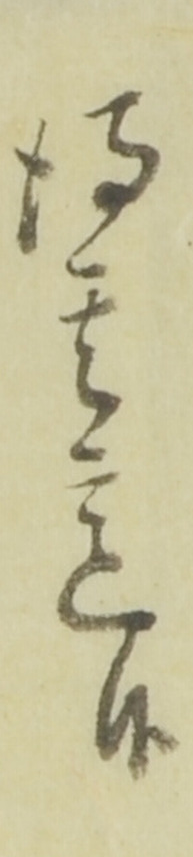得其意候
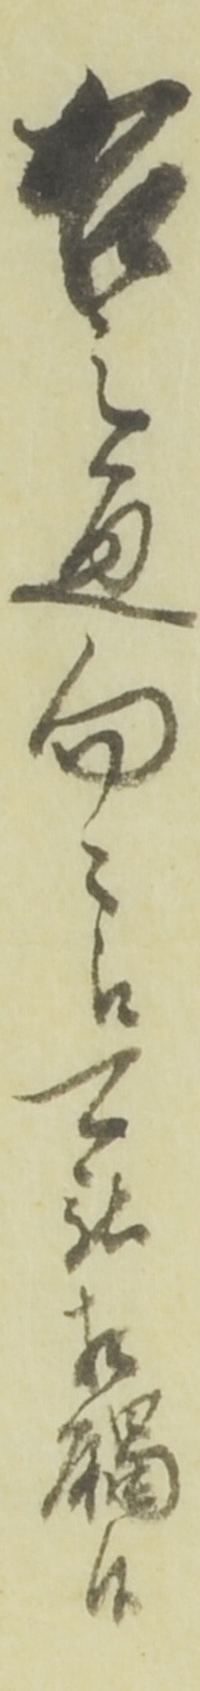右之通向々江可被相触候
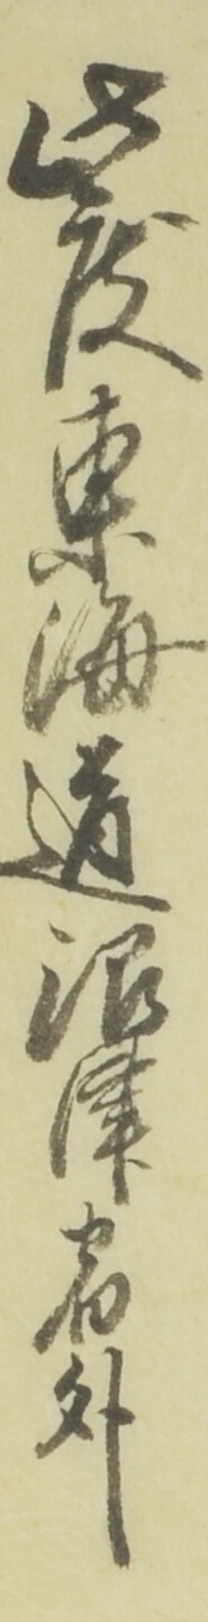此度東海道沼津宿外
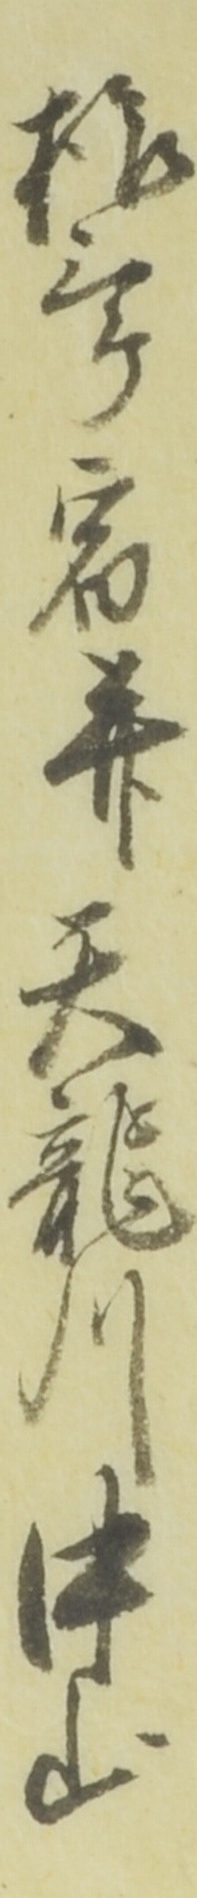拾三ヶ宿并天龍川中山
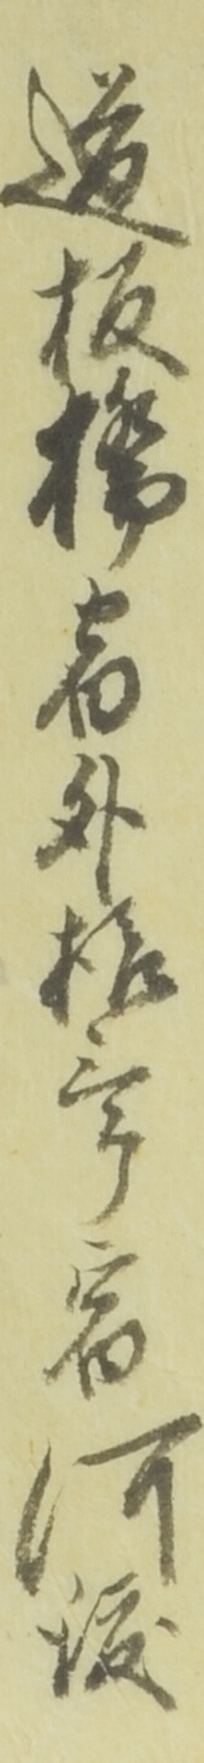道板橋宿外拾三ヶ宿河渡
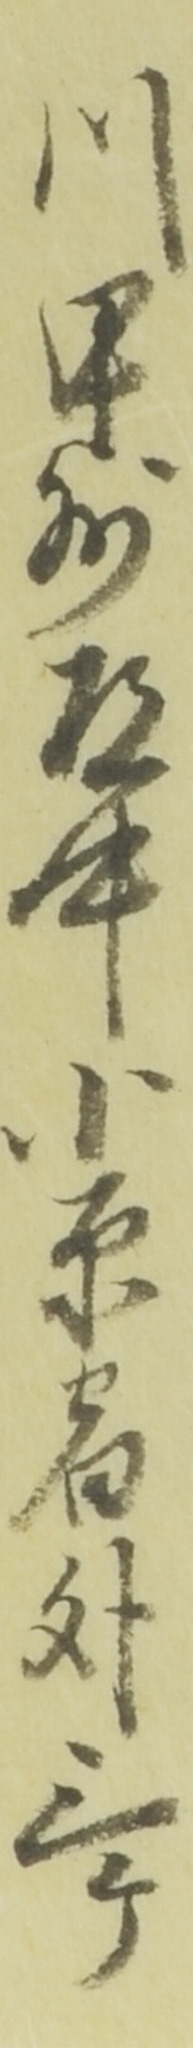川甲州道中小原宿外三ヶ
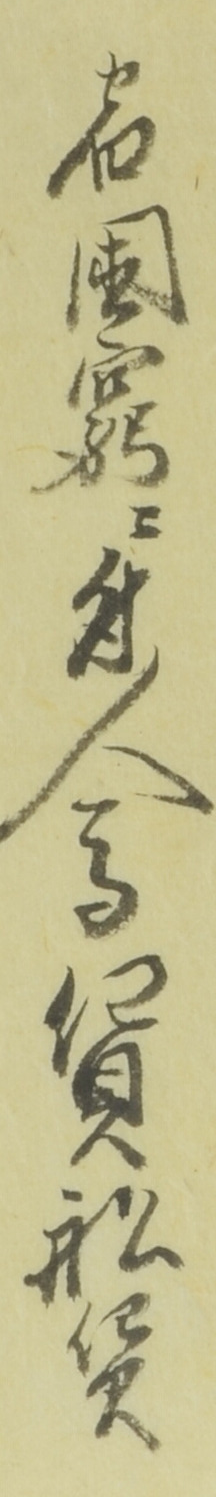宿困窮ニ付人馬賃船賃
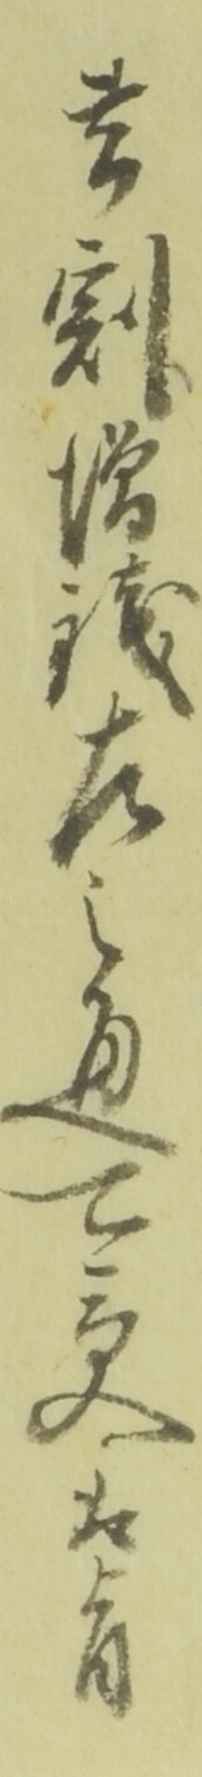共割増銭左之通可受取旨
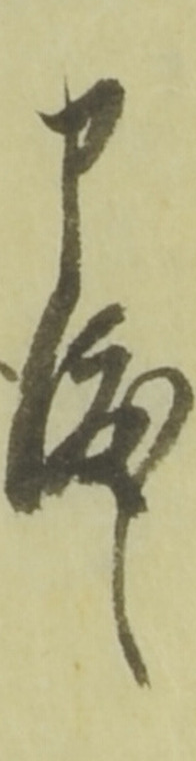申渡候
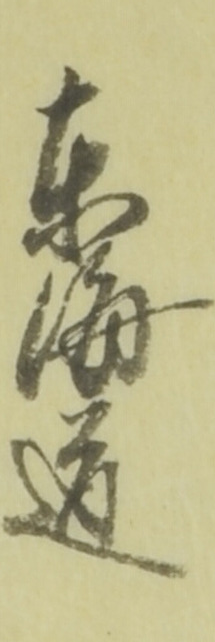東海道
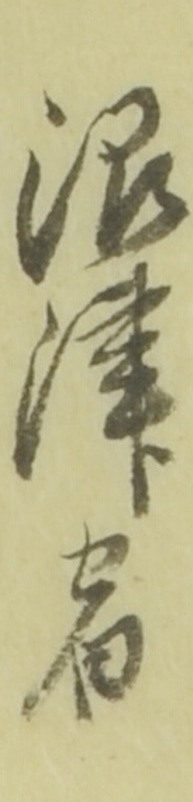沼津宿

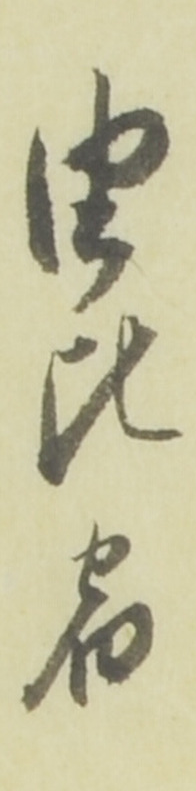由比宿
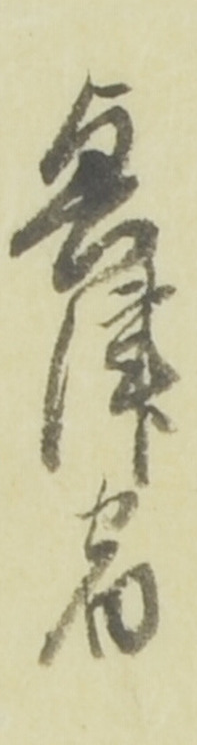興津宿
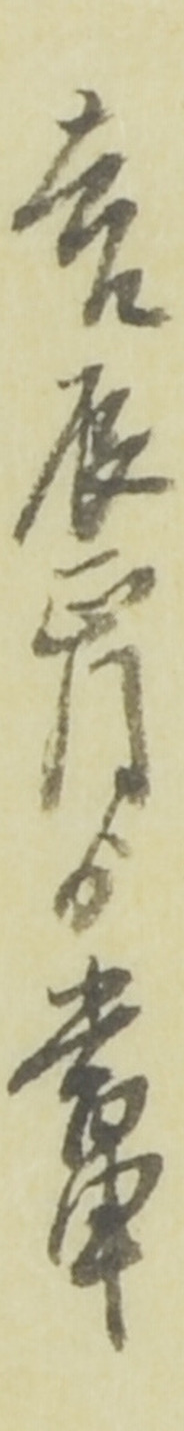去ル辰正月より
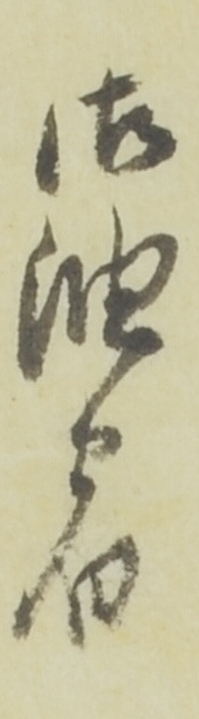御油宿
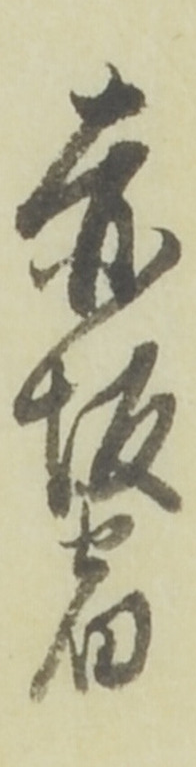赤坂宿
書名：御触書御書附控
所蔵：伊那市立高遠町図書館・合同会社AMANE
